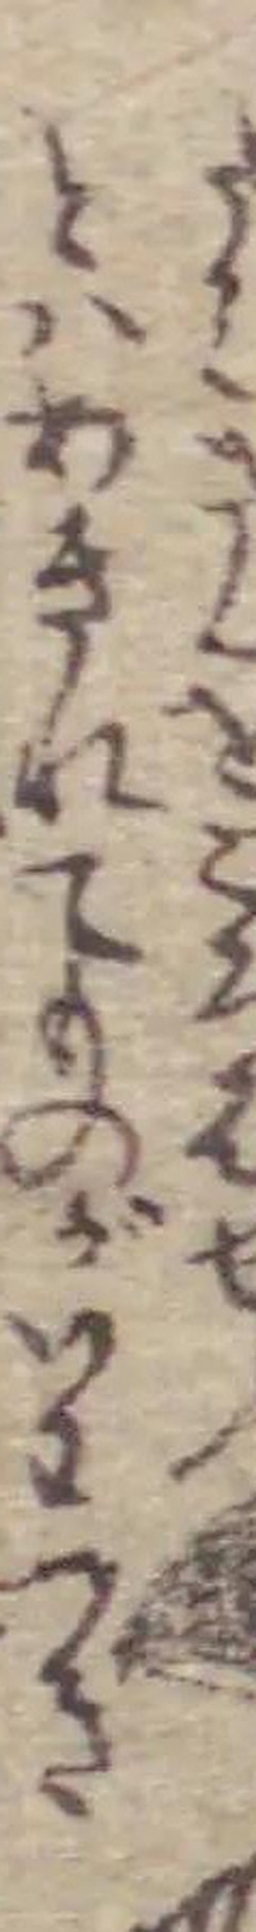とはあきれてものがいわつき
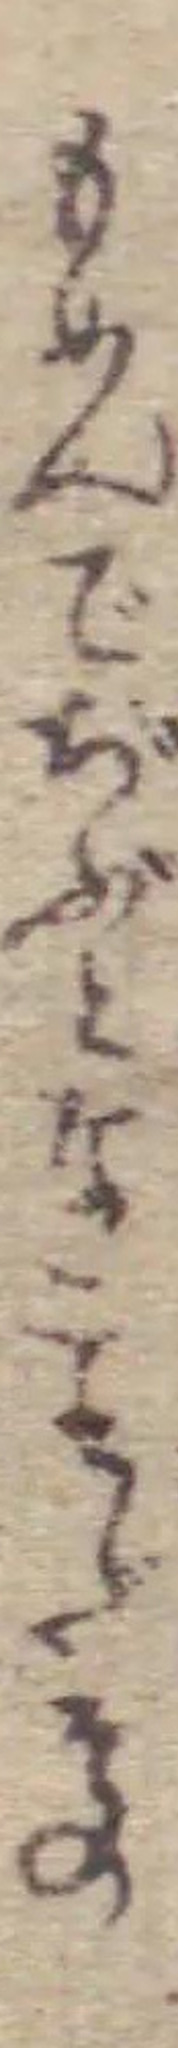もめんでぢぶとなことだその
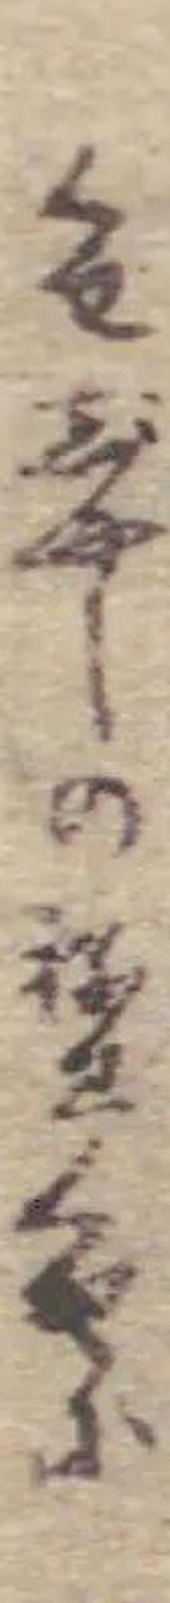くせじやしのねヱくせに

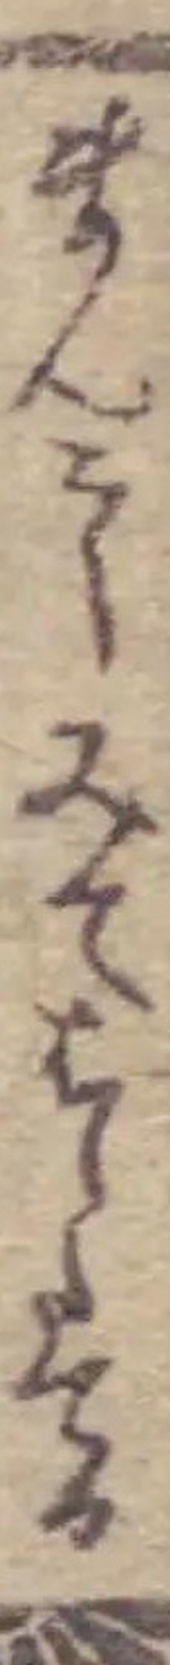まんそうみてはらたてる
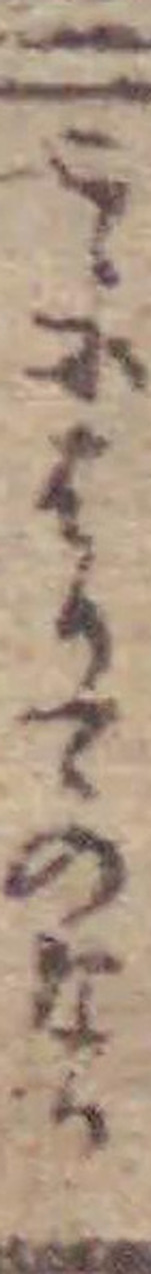こゝにはりてのなか
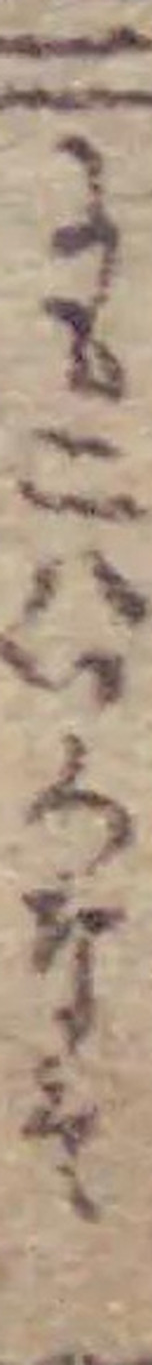にもこはいろなそ
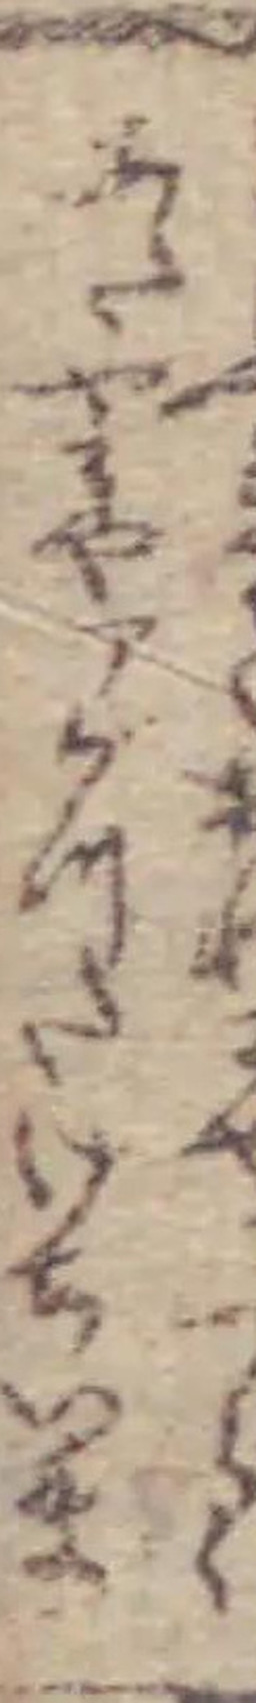あたやりやァがつたけちいま
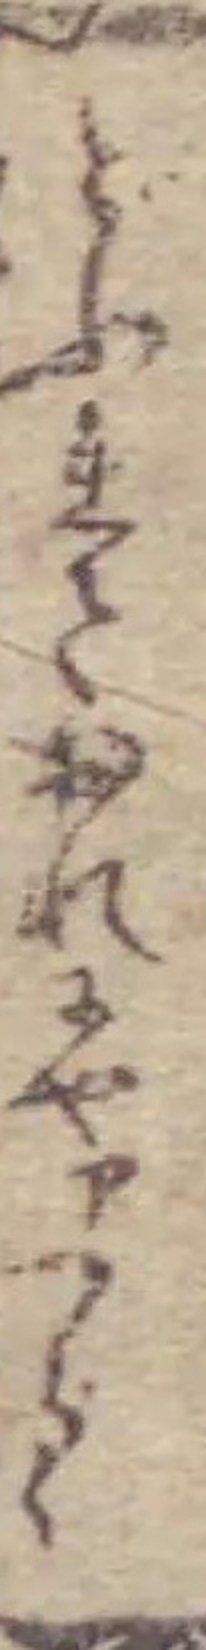どふれておれにやァつらく
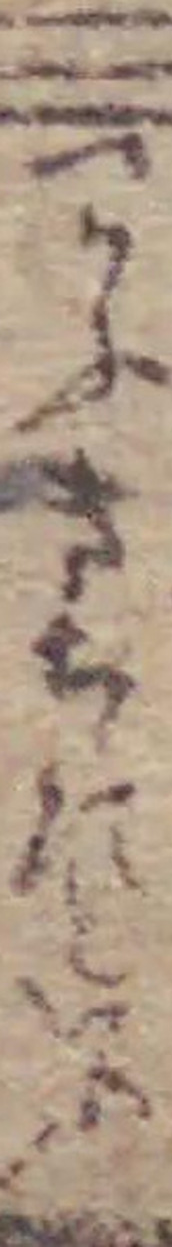つかふきち次といふ
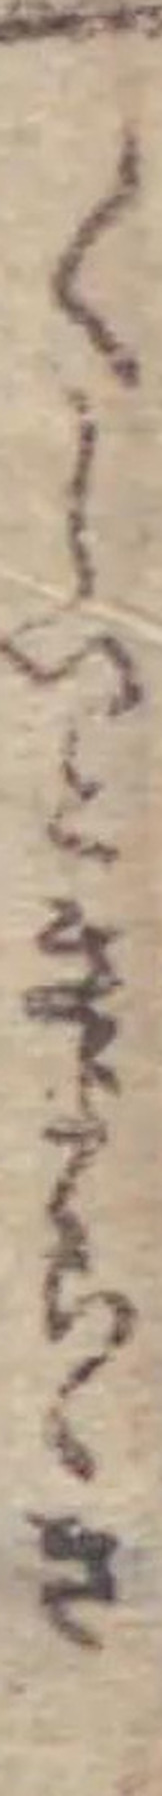〳〵しいときよくらくき
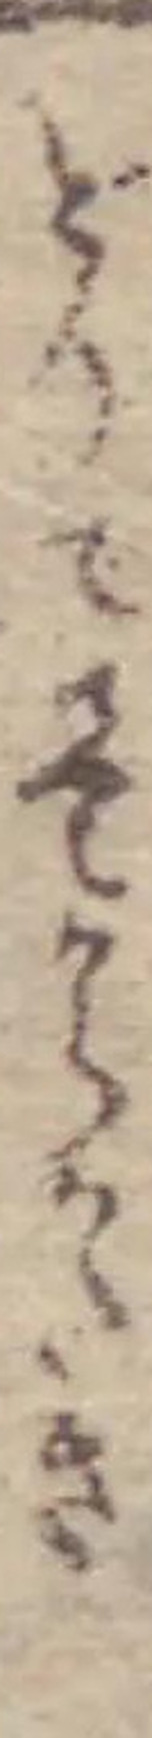どりで是からかたき
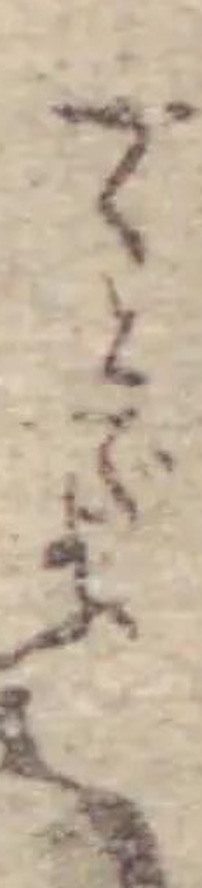やくとでよふ
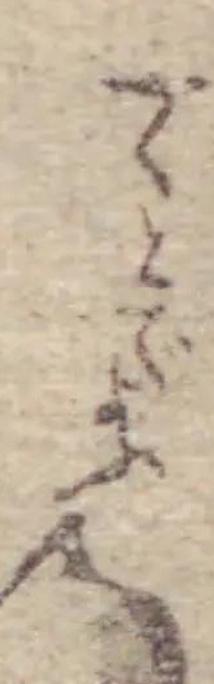やくとでよふ
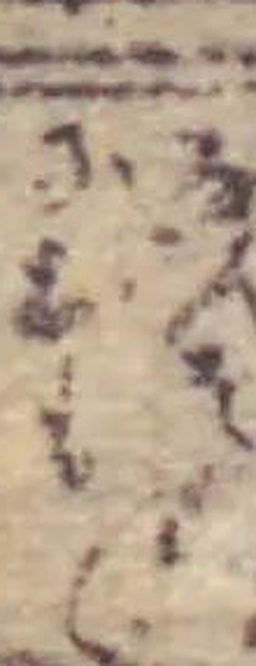におもしろ

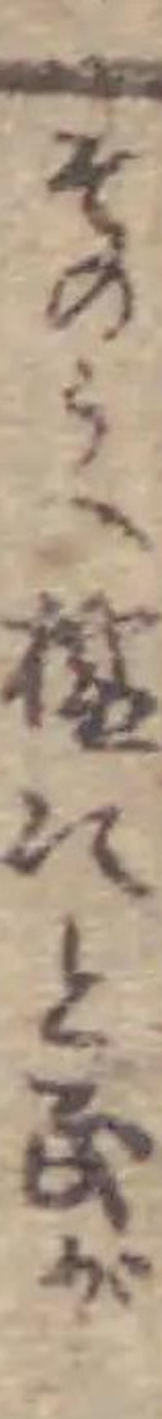そのうへ椹次と民が
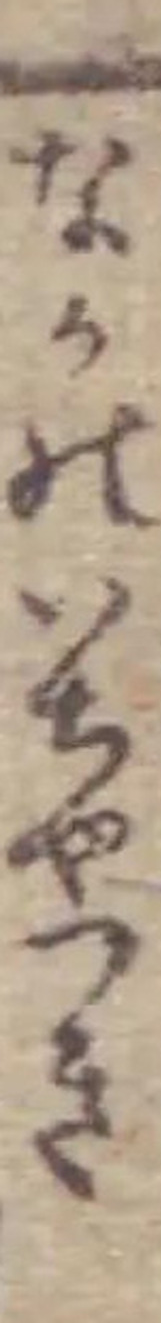なかのいちやつき
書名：通人為真似 2巻
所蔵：国立国会図書館 National Diet Library, JAPAN
